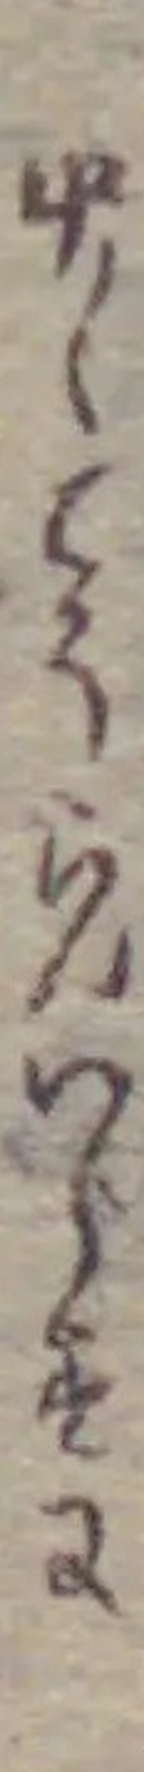中〳〵てうちんいらすに
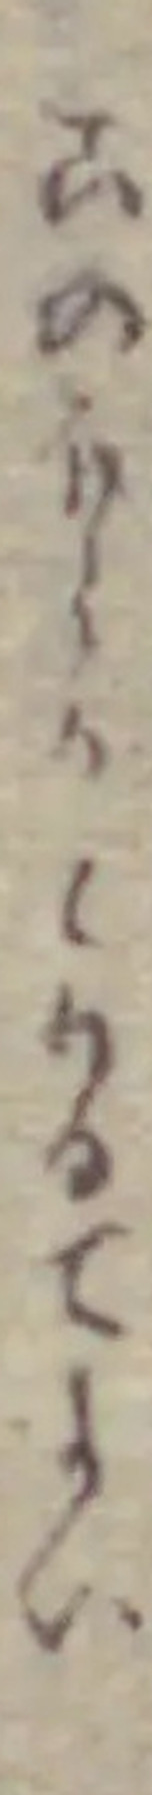このほうかてかるてよい
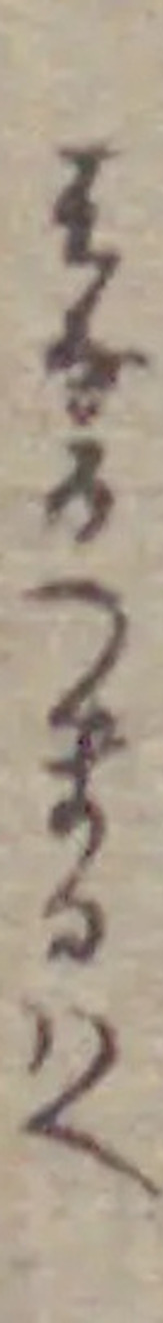はなかつまるはへ

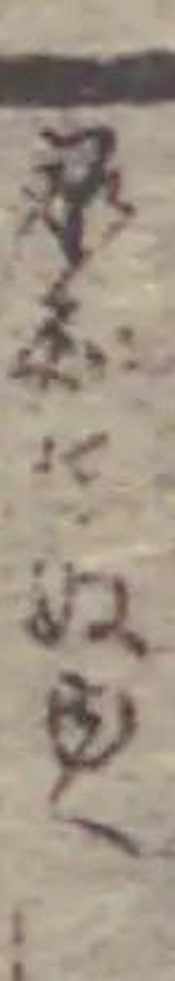承知せぬゆへ
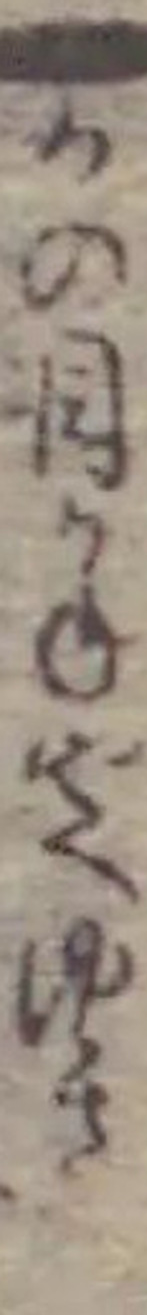かの目かねやへゆき
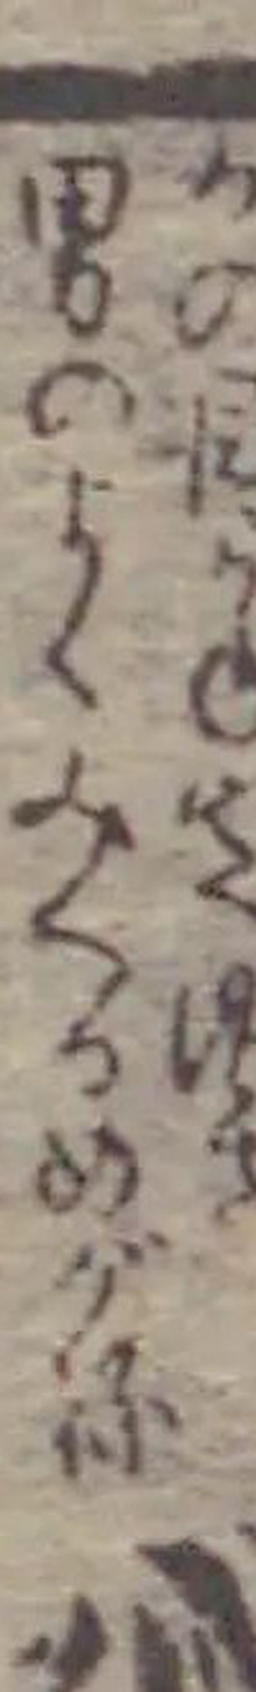男のよくみへるめがね
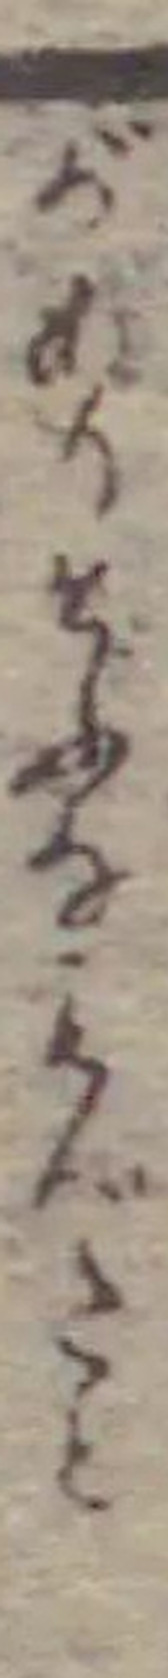がありそふなもんだと
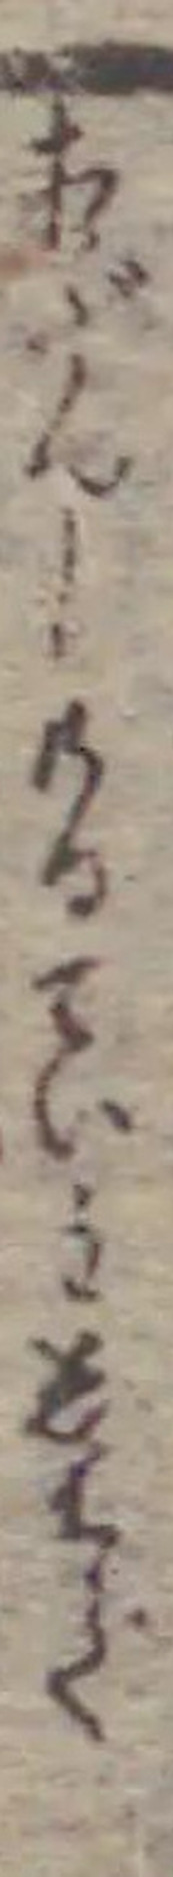相だんしけるてい主しはらく
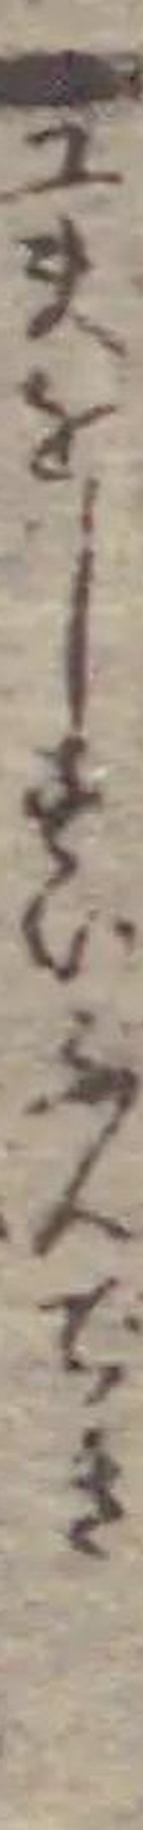工夫をしすいぶんでき
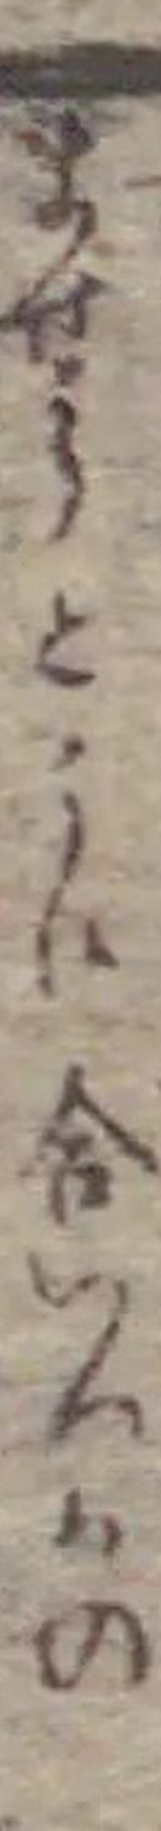ませうとうけ合いつかの
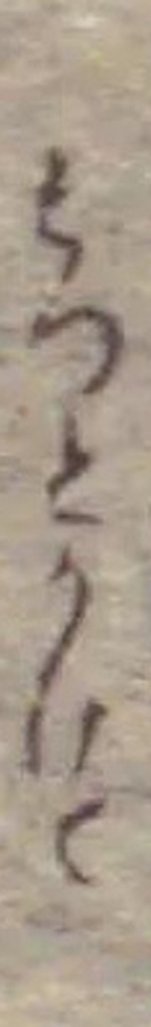そつとかけて
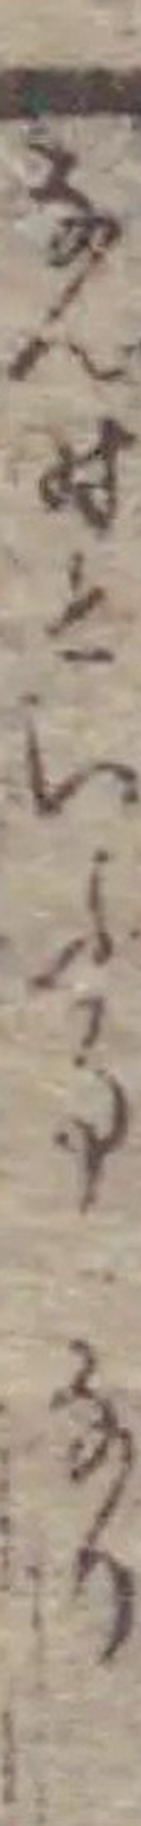なん時といふ事なり
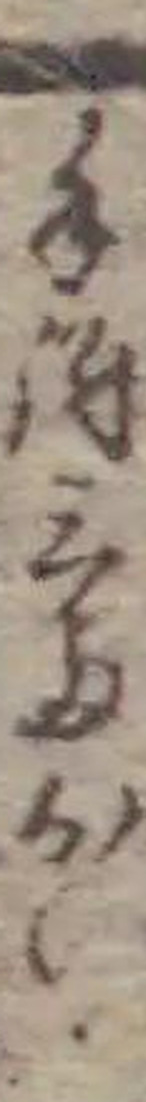手附三両おい
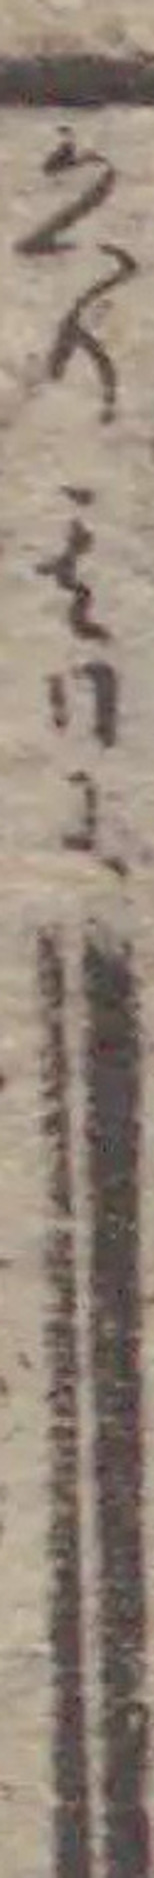かへり其日に
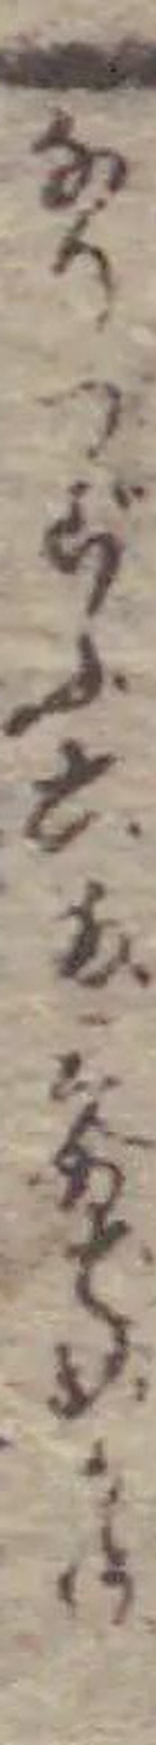なりつごふ六両三分でめかね
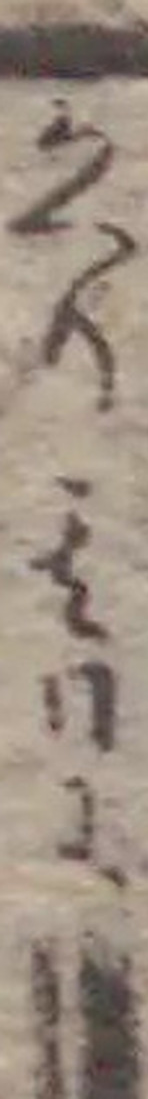かへり其日に
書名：栄増眼鏡徳 3巻
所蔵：国立国会図書館 National Diet Library, JAPAN
